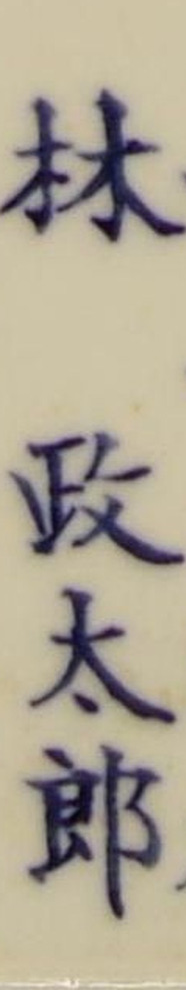林政太郎
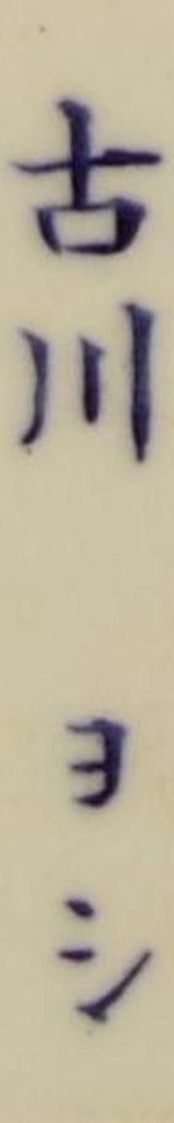古川ヨシ
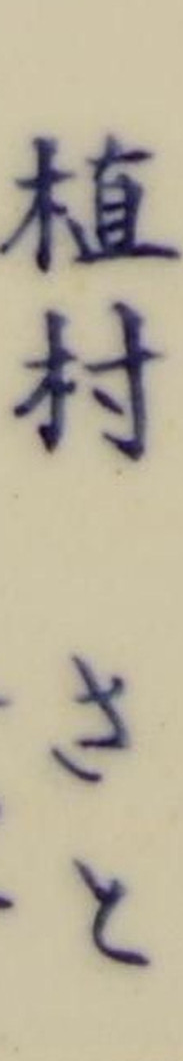植村さと
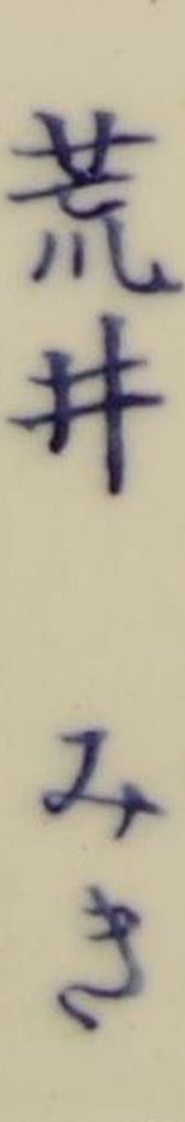荒井みき
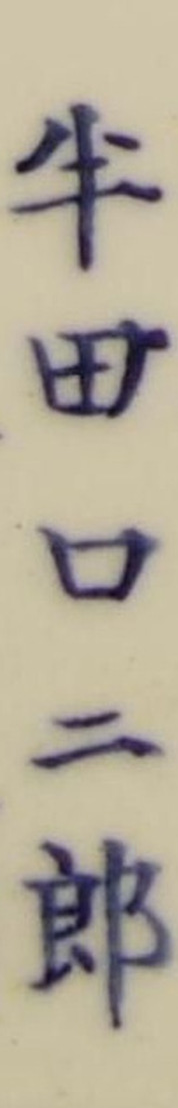半田口二郎
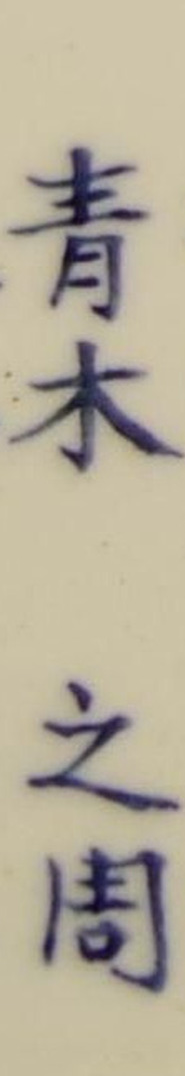青木之周
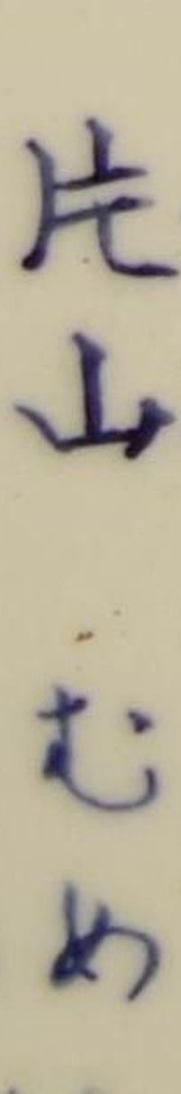片山むめ
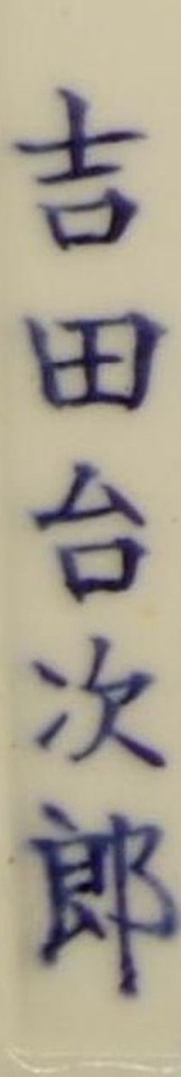吉田台次郎

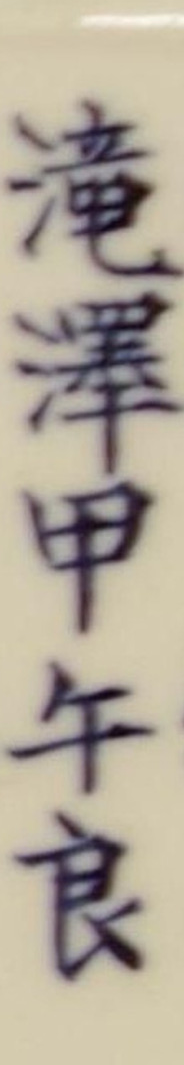滝澤甲午良
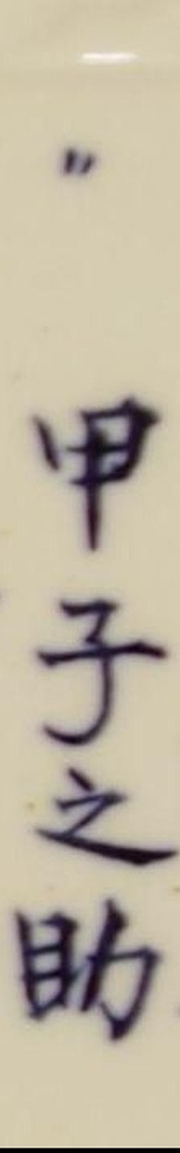甲子之助
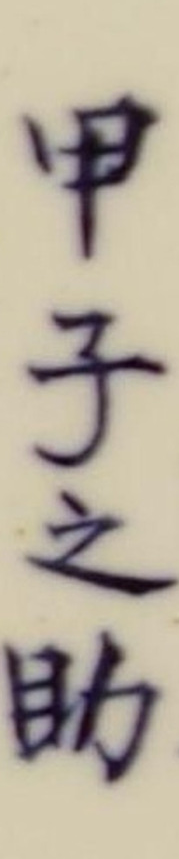甲子之助
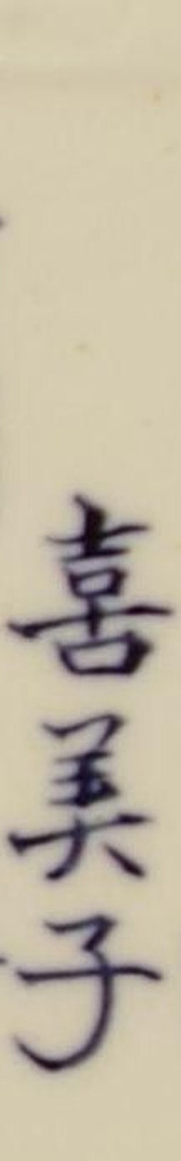喜美子
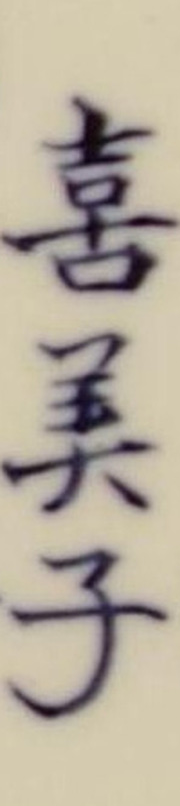喜美子
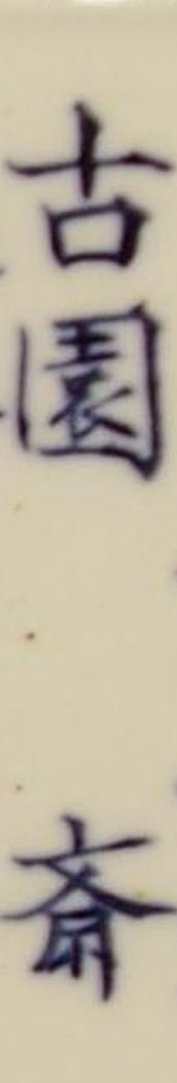古園斎
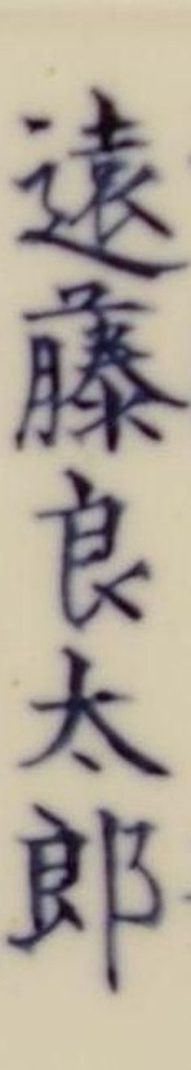遠藤良太郎
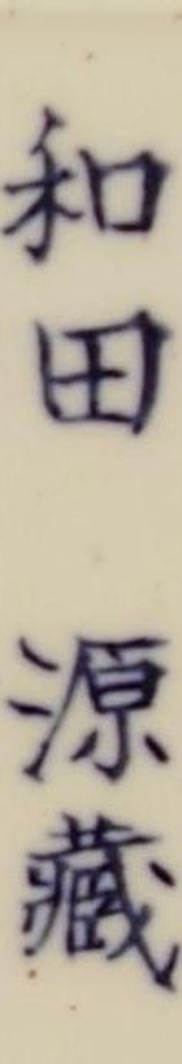和田源蔵
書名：E~L
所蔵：高野山金剛峯寺
